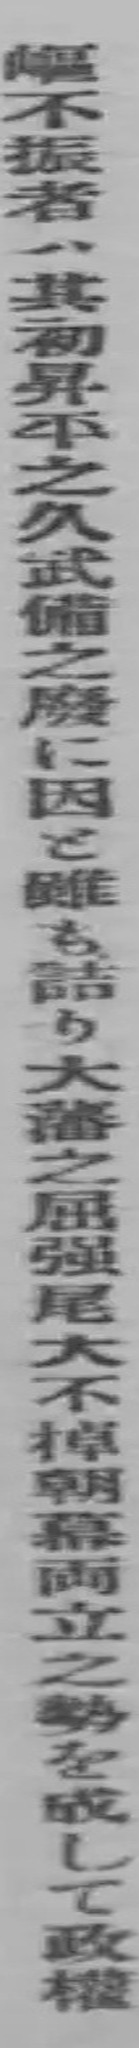嶇不振者ハ其初昇平之久武備之廃に因と雖も詰り大藩之屈強尾大不棹朝幕両立之勢を成して政権
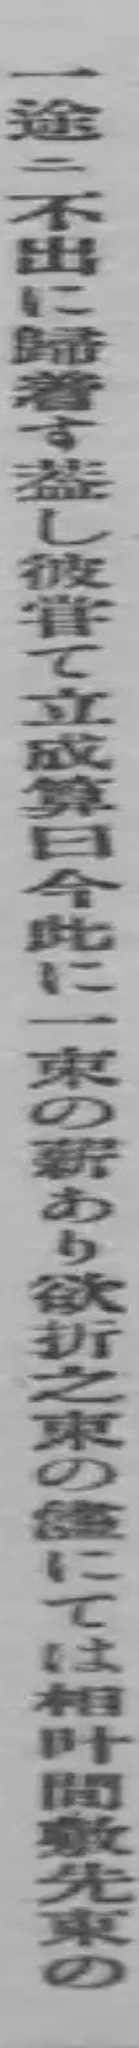一途ニ不出に帰着す蓋し彼嘗て立成算曰今此に一束の薪あり欲折之東の侭にては相叶間敷先東の
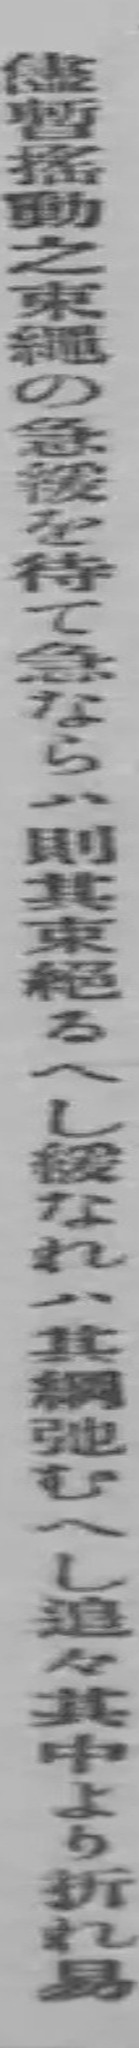侭暫揺動之東縄の急緩を待て急ならハ則其束絶るへし緩なれハ其綱弛むへし追々其中より折れ易
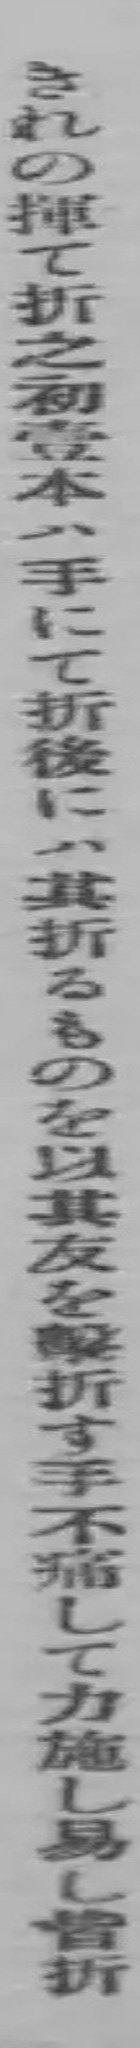きれの揮て折之初壱本ハ手にて折後にハ其折るものを以其友を襲折す手不痛して力施し易し皆折
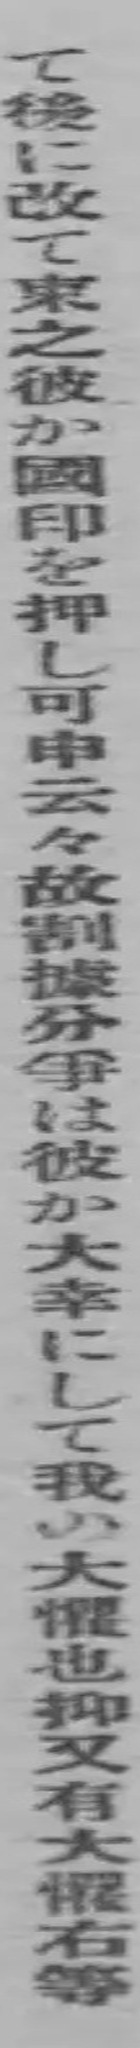て後に改て東之彼か国印を押し可申云々故割拠分争は彼か大幸にして我の大懽也抑又有大懽右等
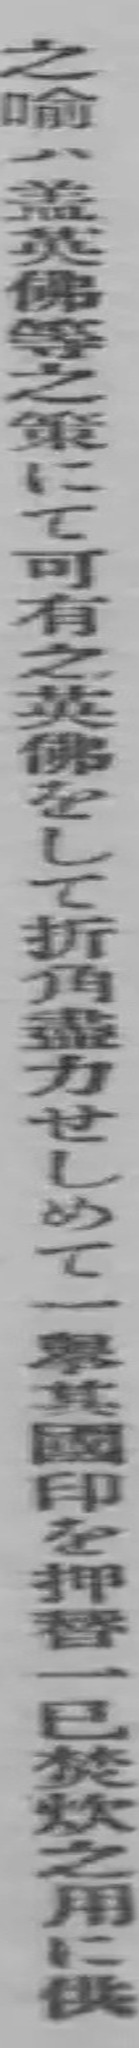之喩ハ盖英仏等之策にて可有之英仏をして折角尽力せしめて一挙其国印を押替一巳焚炊之用に供
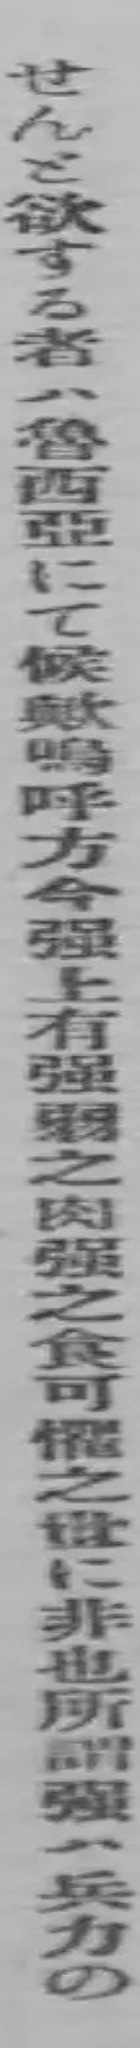せんと欲する者ハ魯西亜にて候歟嗚呼方今強上有強弱之肉強之食可懼之世に非也所謂強ハ兵力の
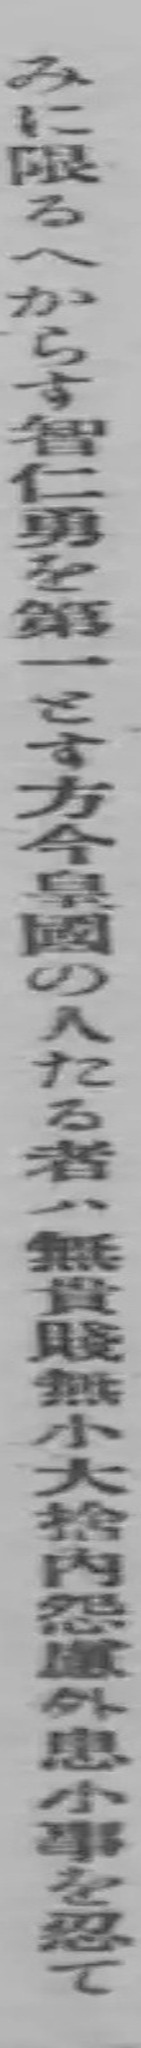みに限るへからす智仁勇を第一とす方今皇国の人たる者ハ無貴賤無小大捨内怨慮外患小事を忍て
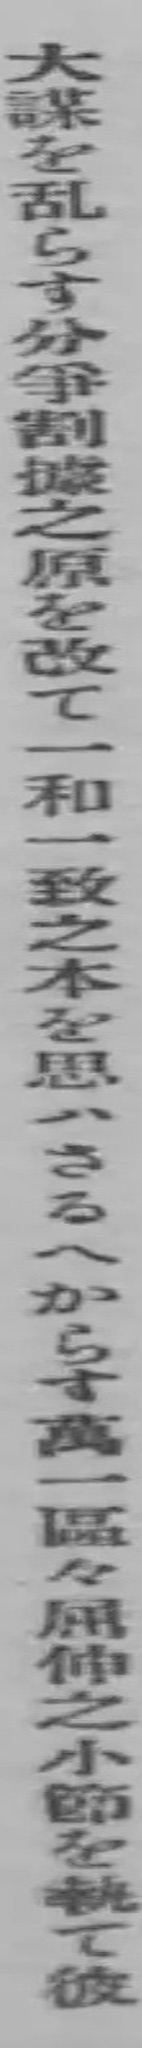大謀を乱らす分争割拠之原を改て一和一致之本を思ハさるへからす万一区々屈伸之小節を執て彼
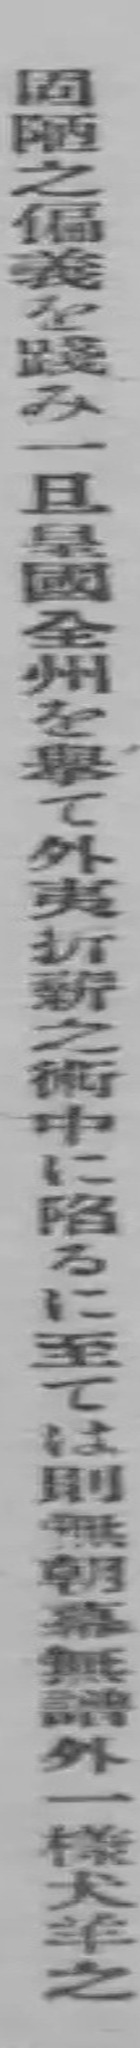固陋之偏義を踐み一旦皇国全州を挙て外患折薪之術中に陥るに至ては則無朝幕無譜外一様犬羊之
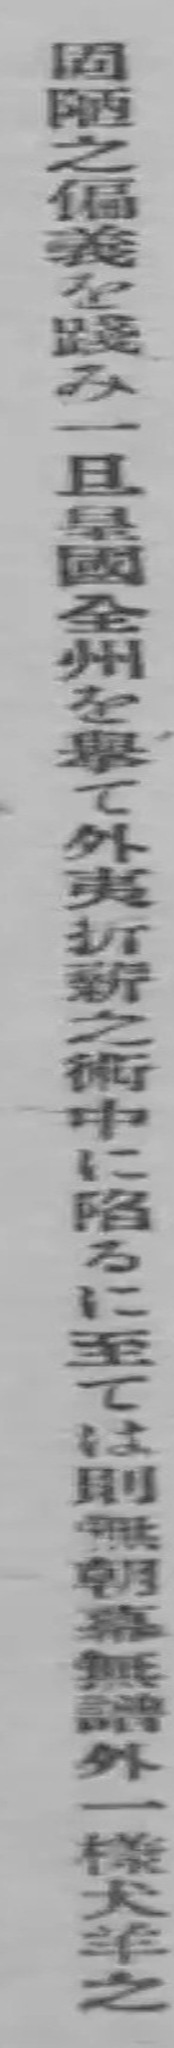固陋之偏義を踐み一旦皇国全州を挙て外患折薪之術中に陥るに至ては則無朝幕無譜外一様犬羊之
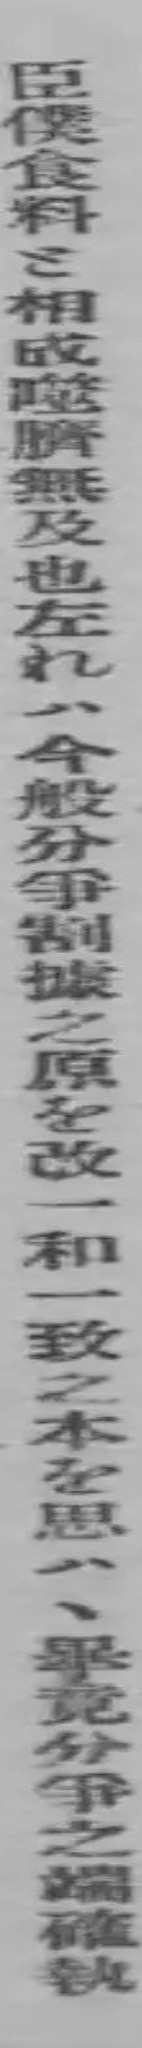臣僕食料と相成噬臍無及也左れハ今般分争割拠之原を改一和一致之本を思ハヽ畢竟分争之端確執
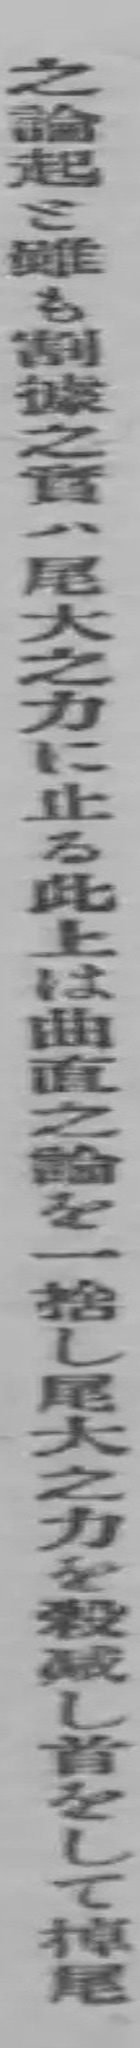之論起と雖も割拠之實ハ尾大之力に止る此上は曲直之論を一捨し尾大之力を殺減し首をして棹尾
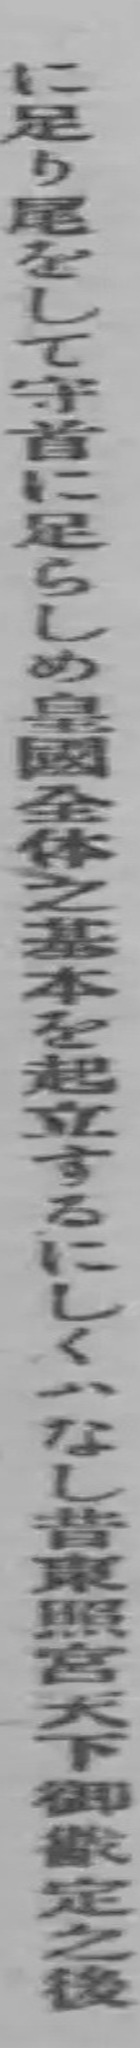に足り尾をして守首に足らしめ皇国全体之基本を起立するにしくハなし昔東照宮天下御定之後
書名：豊橋市史談
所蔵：国立国会図書館 National Diet Library, JAPAN
